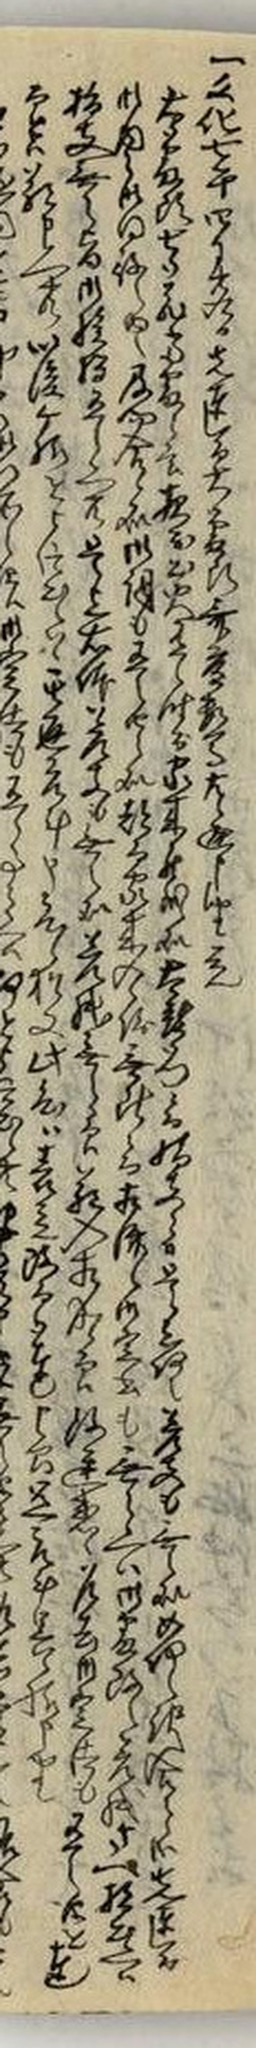御内々御同役之内へ及問合候処御伺も有之由候処都而家来入候儀無断に而相済候御定書も無之候へは御番改之差紙さへ指出候へは
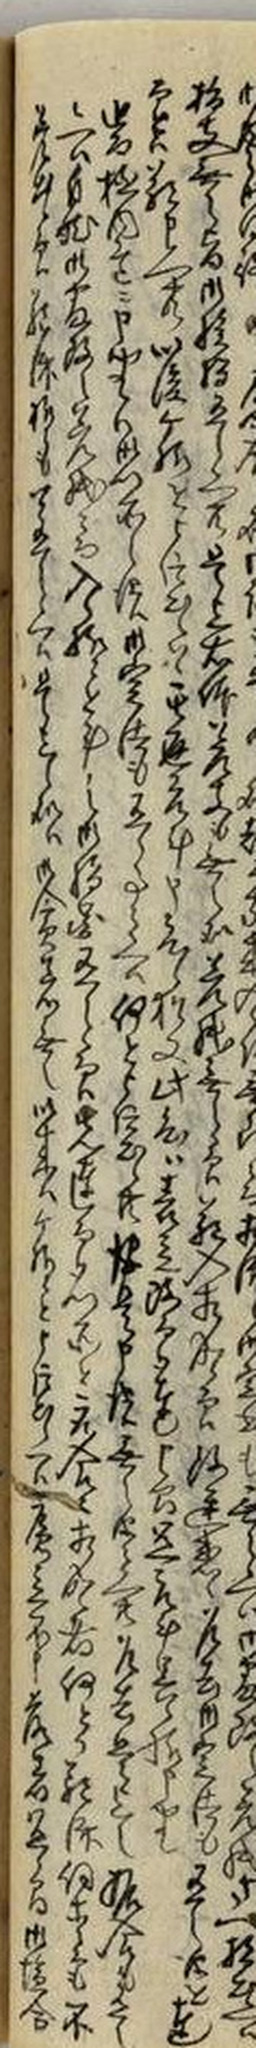追而極内意に申聞候は御門所之儀は御定法有之候事に候へは何と被仰出候共彼是申儀は無之儀に候へ共乍去是迄之振合も有之
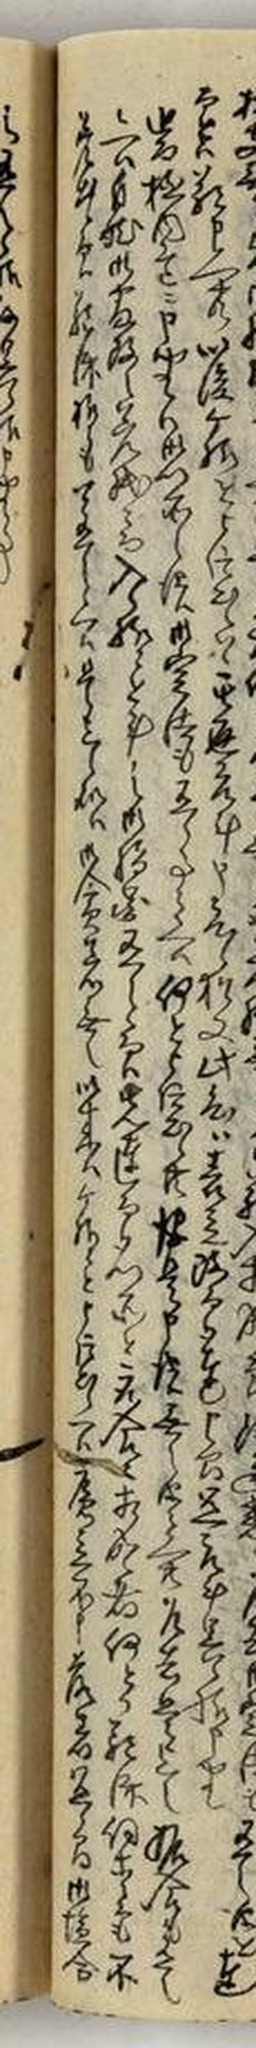候へは自然御番改之差紙に而入候様にと斗之御指図有之候而は先達而御門所と取合に相成候者何とか難済伺等に而も不
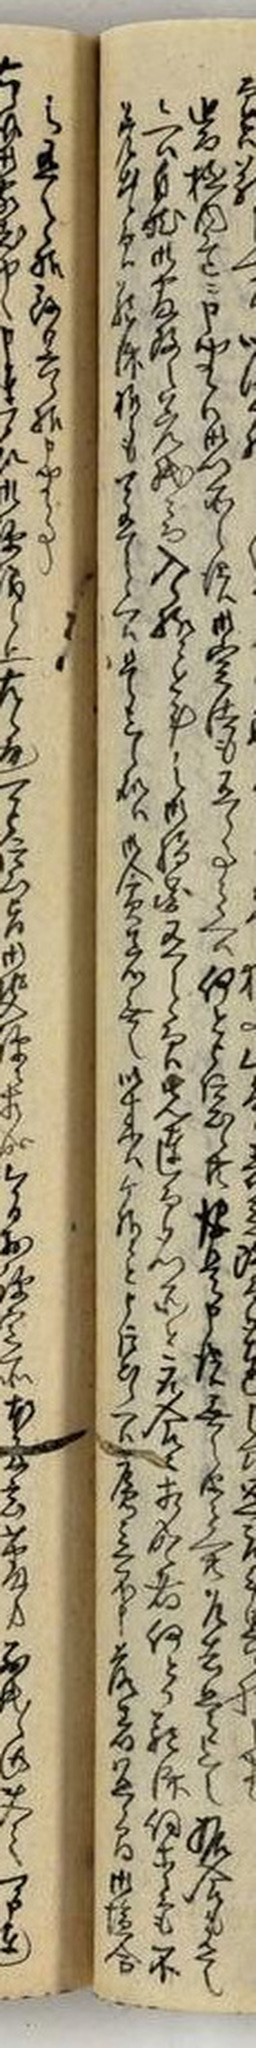差出候而は難済様にも可有之候へは是迄之処は御貪着無之以来はヶ様にと被仰出候へは廉立不申落着宜候間御塩合
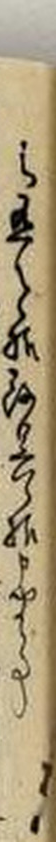之有之候様致呉候様申聞候事
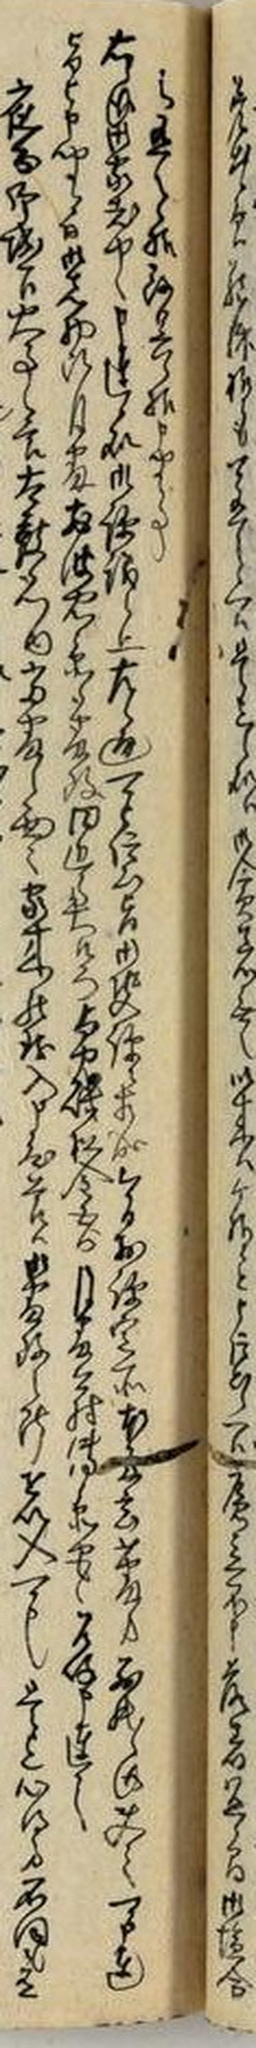右之趣御家老中へ申達候処御評議之上左之通可被仰出候旨御決評に相成今日於評定所本多玄蕃方罷出候趣使夫々可申達
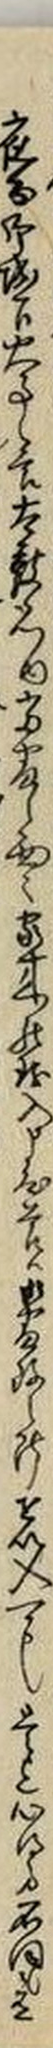夜分御城下火事之節太鼓御門内当番之面々家来罷越入申度節は御番改之断を以入可申候是迄心得方不同も有
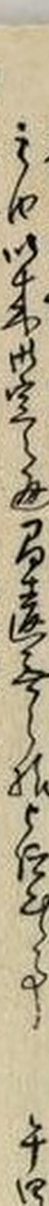之候由以来御定之通間違無之候様被仰出候事
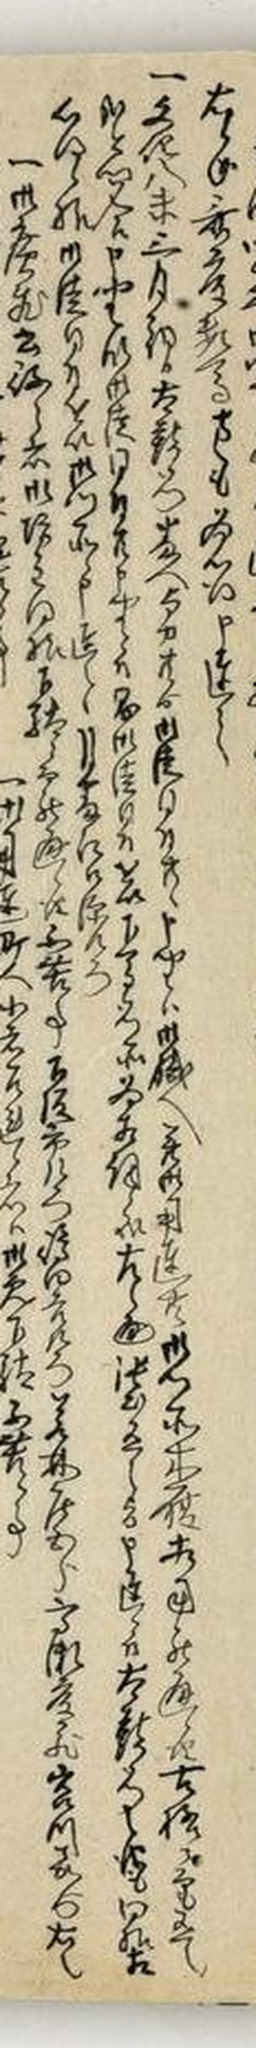哉と問合申聞候段御徒目付共申聞候に付則御徒目付を以下馬御門所為相伺候処左之通張出有之旨申達候に付太鼓御門之儀も同様相
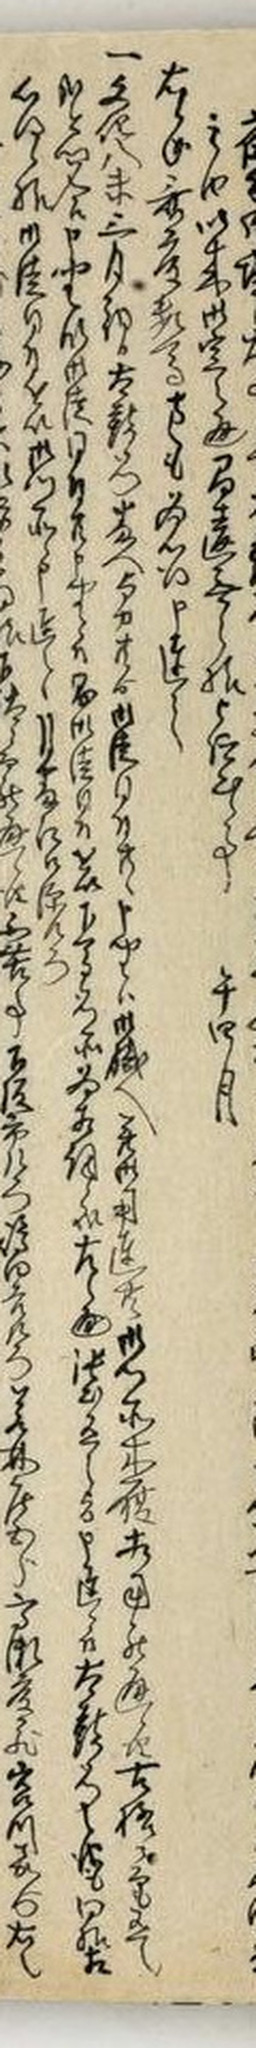一文化八未三月朔日太鼓御門番人与力共ゟ御徒目付共へ申聞候は御職人并御用達共御門所木履相用罷通候儀古格に而も有之
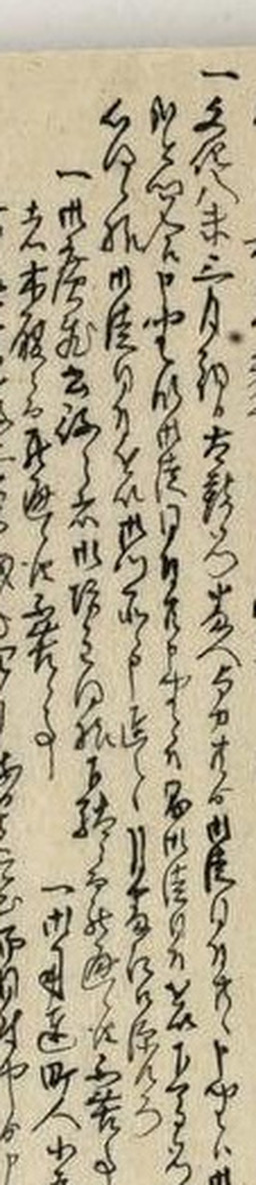心得候様御徒目付を以御門所へ申達之候月番江口源左衛門
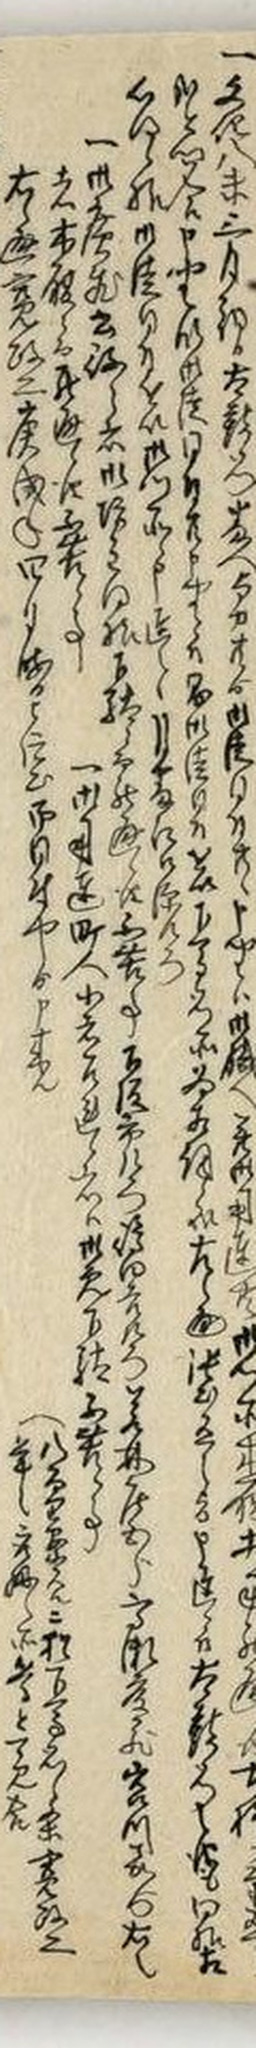一御広敷書役之者御坊主同様下駄に而罷通候儀不苦候事下坂市左衛門嶋田吉左衛門若林庄五郎高瀬藤蔵宮川嘉右衛門右之
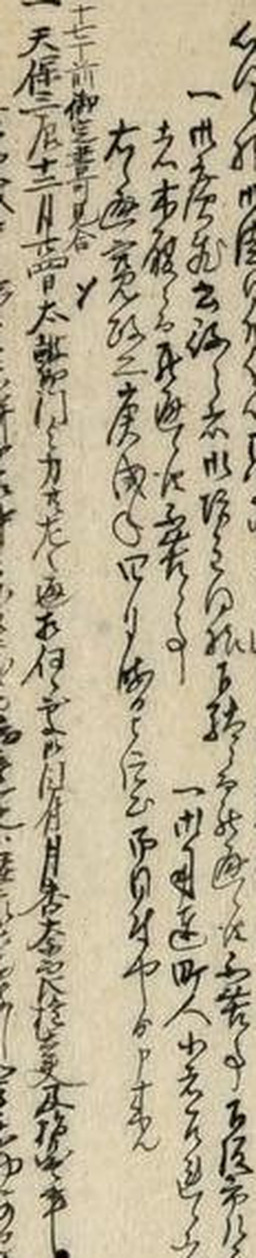右之通寛政二庚戌年四月晦日被仰出御目付中ゟ申来ル
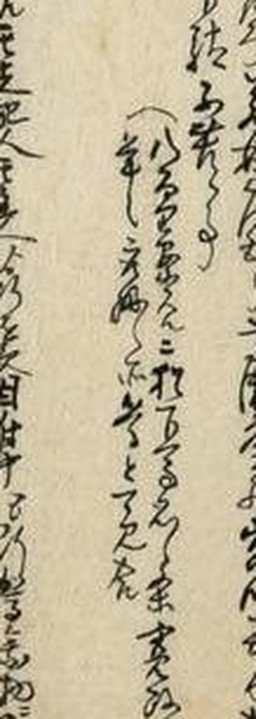年之取扱之所篤と可見合
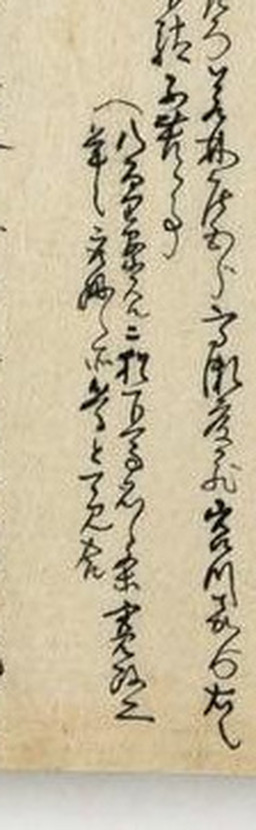八百里案スルニ猶下馬御門之条寛政二
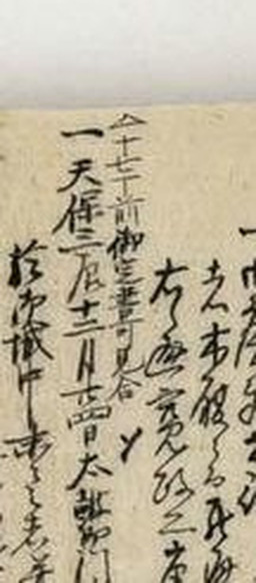△十七丁前御定書可見合
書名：御門御櫓之部
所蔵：福井県文書館 Fukui Prefectural Archives
